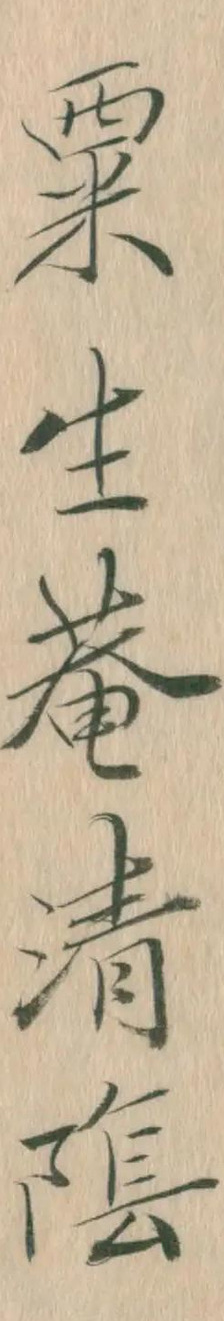粟生菴清陰

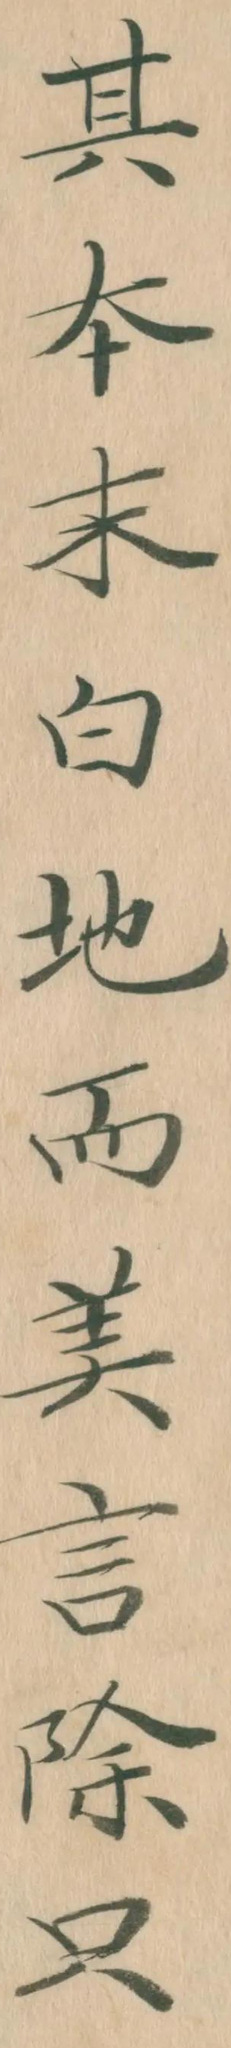其本末白地而美言除只
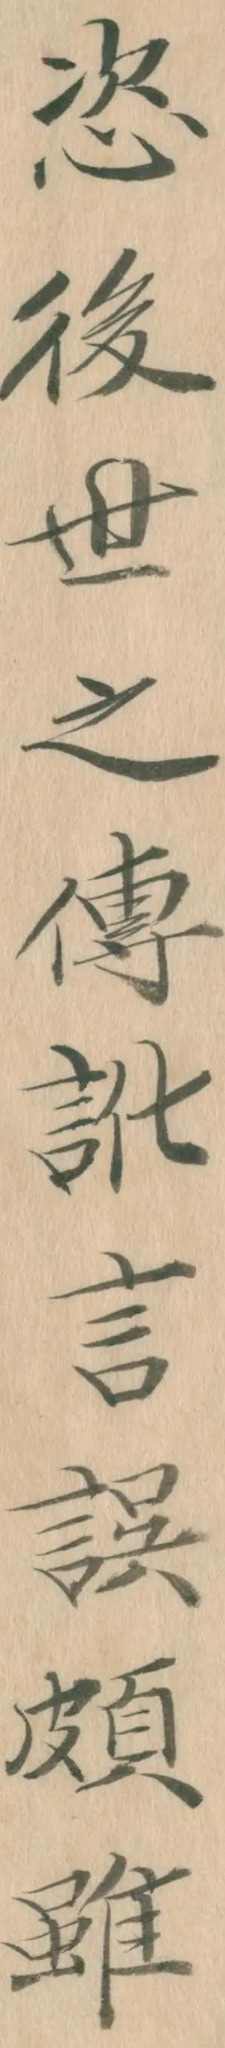恣後世之伝訛言誤頗雖
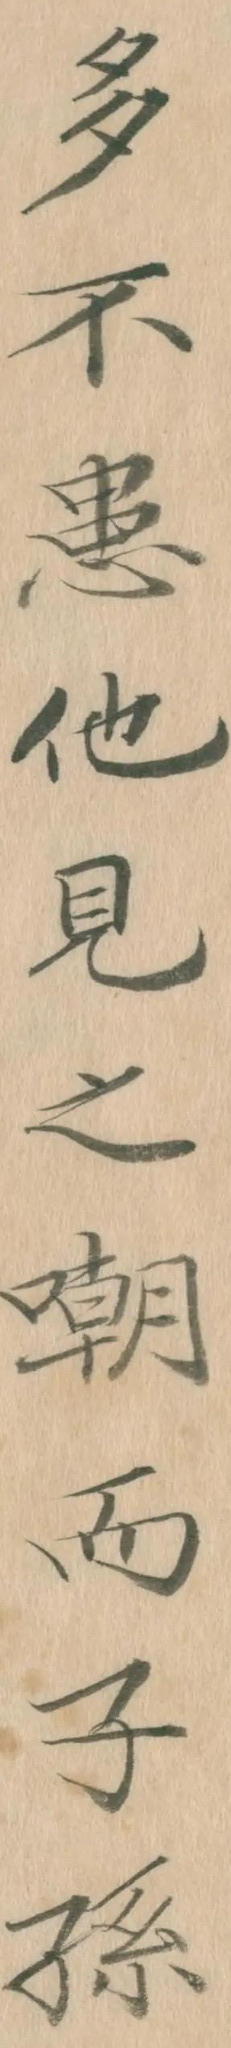多不患他見之嘲而子孫
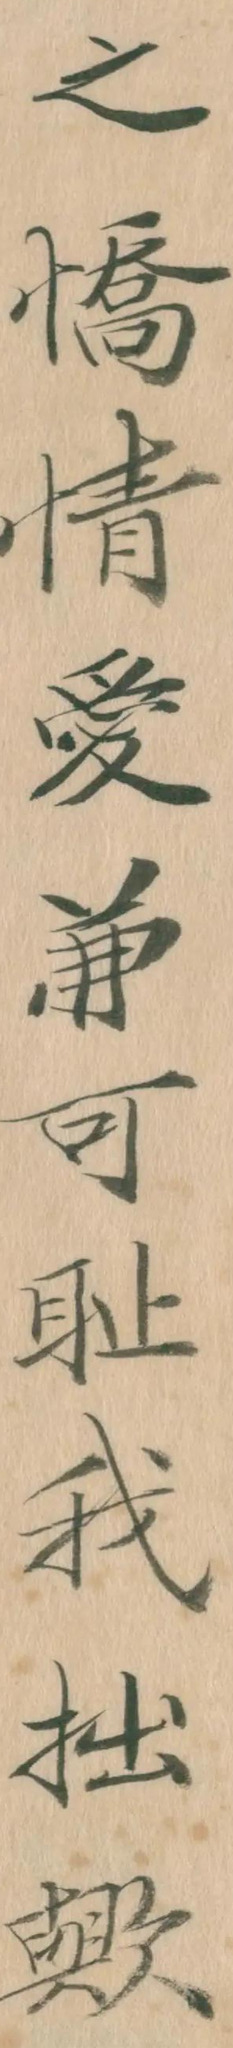之憍情愛兼可恥我拙歟
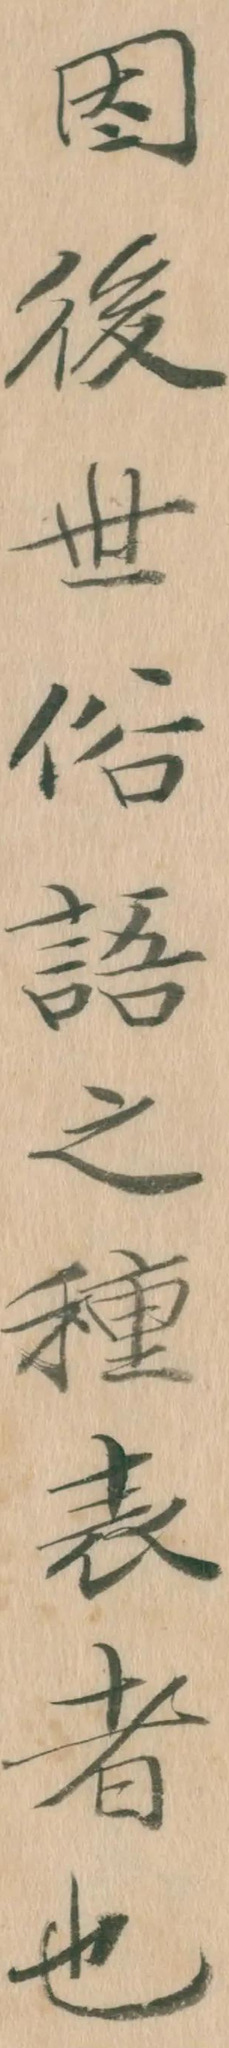因後世俗語之種表者也
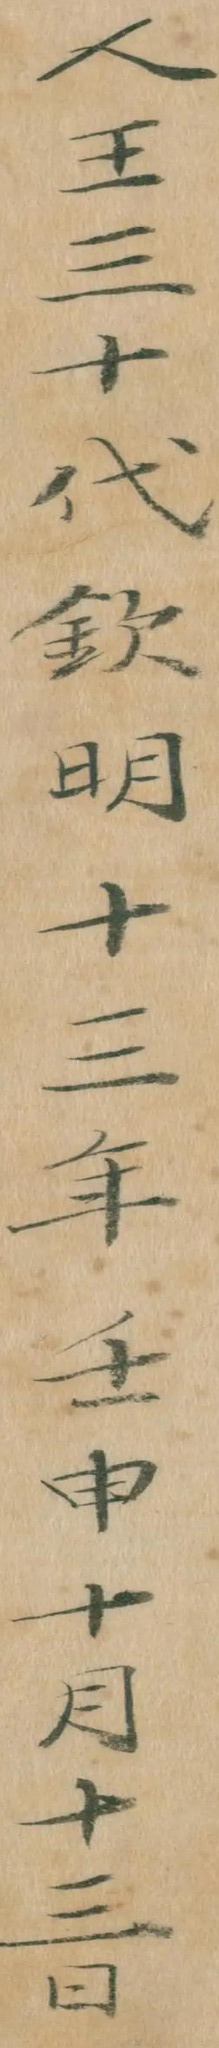人王三十代欽明十三年壬申十月十三日
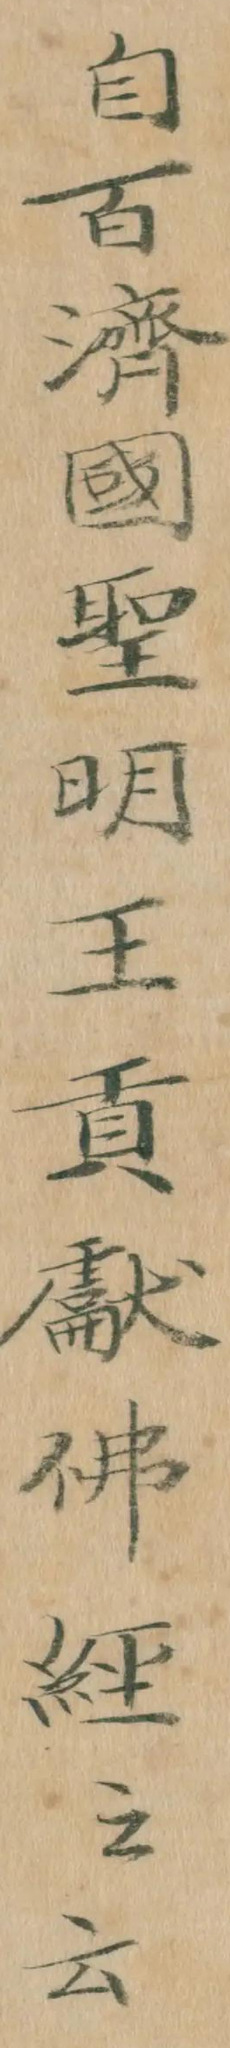自百済国聖明王貢献仏経之云
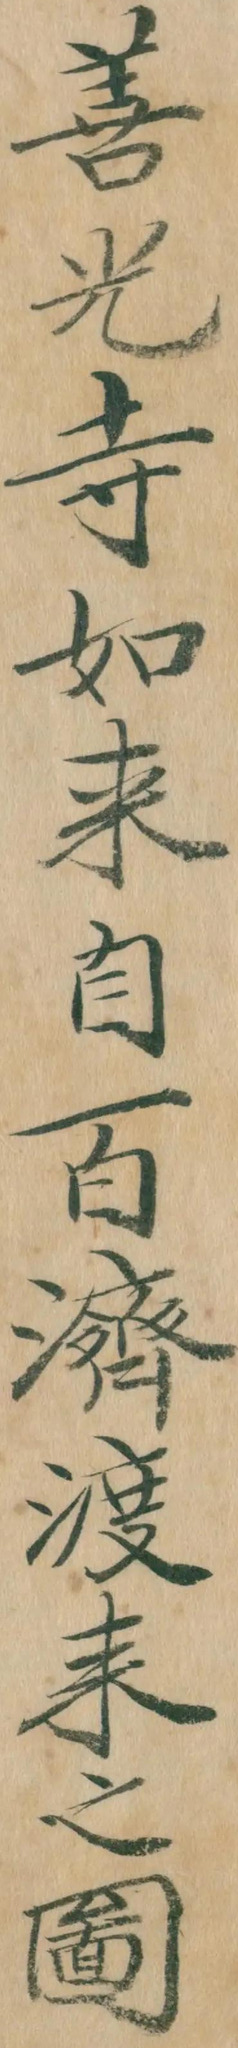善光寺如来自百済渡来之図

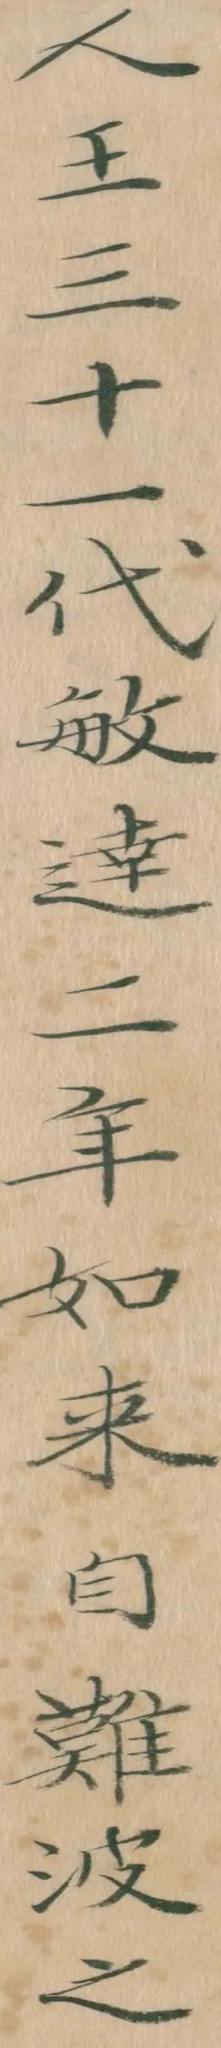人王三十一代敏達二年如来自難波之
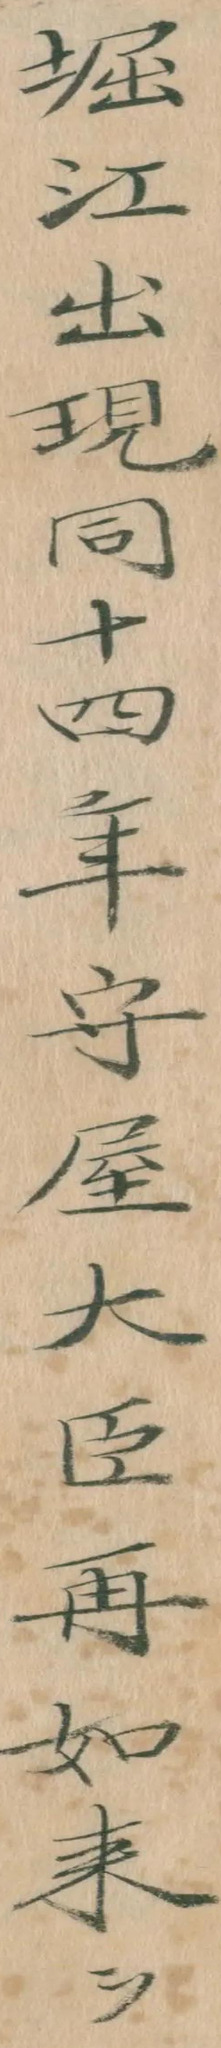堀江出現同十四年守屋大臣再如来ヲ
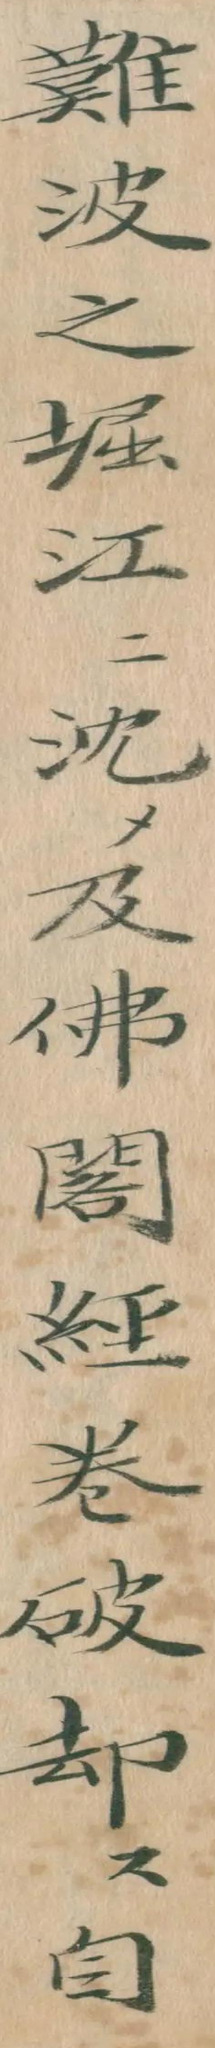難波之堀江ニ沈メ及仏閣経巻破却ス自
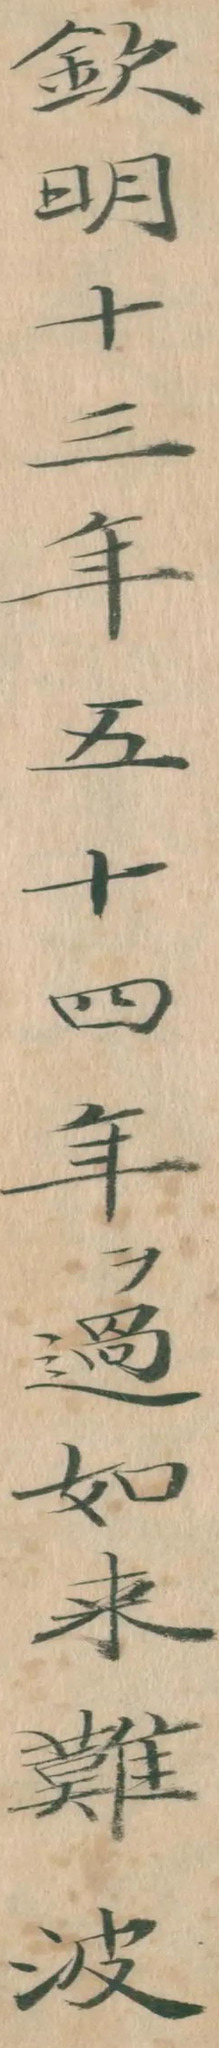欽明十三年五十四年ヲ過如来難波
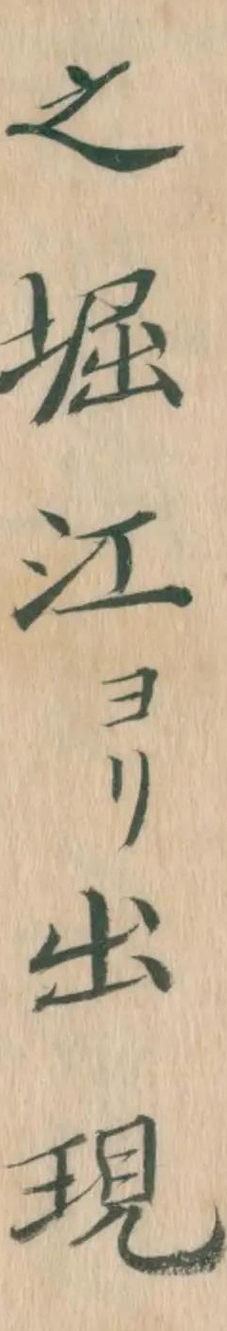之堀江ヨリ出現
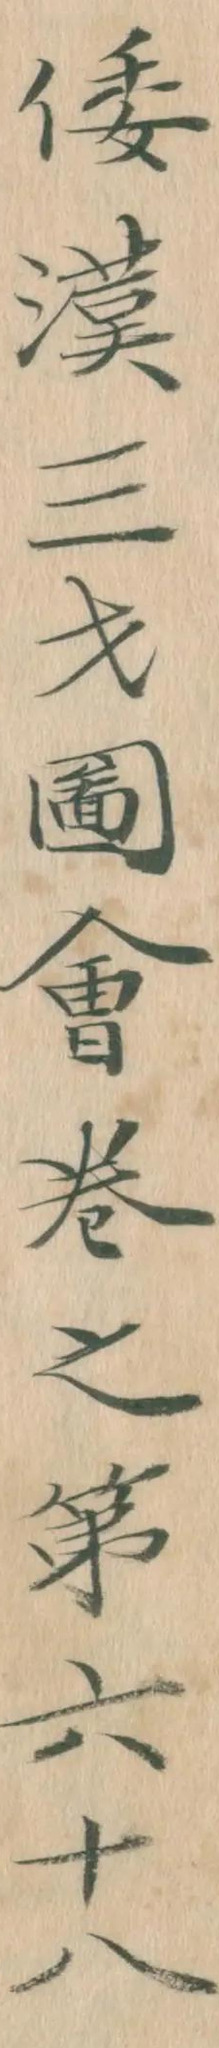倭漢三才図会巻之第六十八
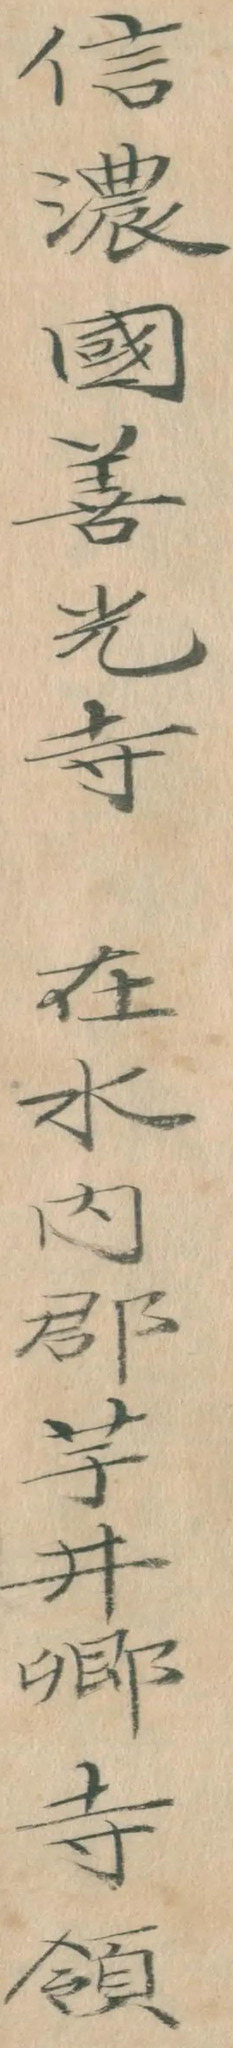信濃国善光寺在水内郡芋井郷寺領
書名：俗語之種. [1]
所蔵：国立国会図書館 National Diet Library, JAPAN
